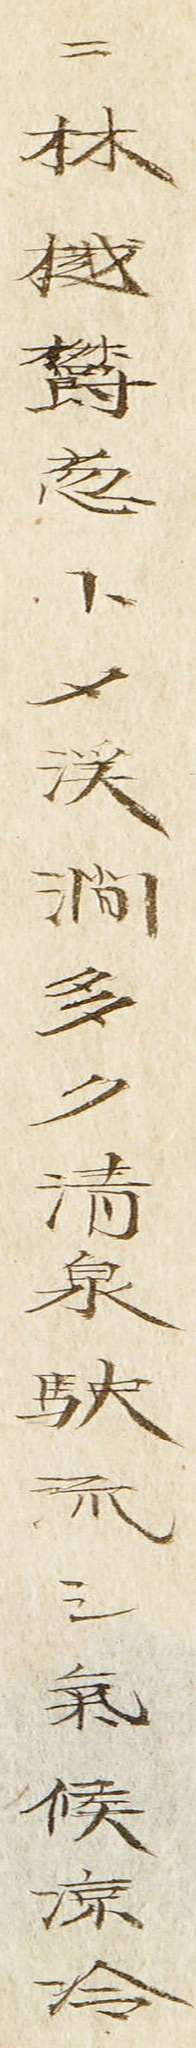ニ林樾鬱葱トシテ渓澗多ク清泉駚流シ気候涼冷
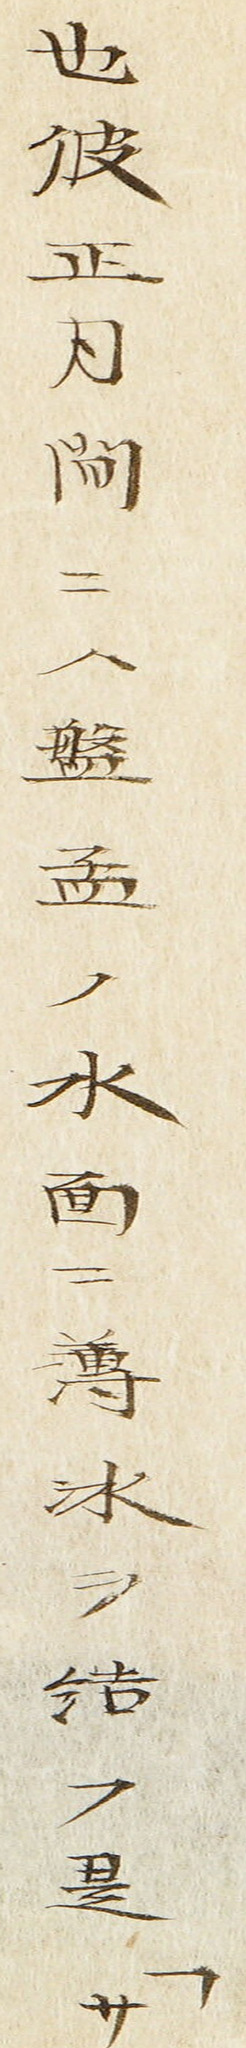也彼正月間ニハ盤孟ノ水面ニ薄冰ヲ結フ是「サ
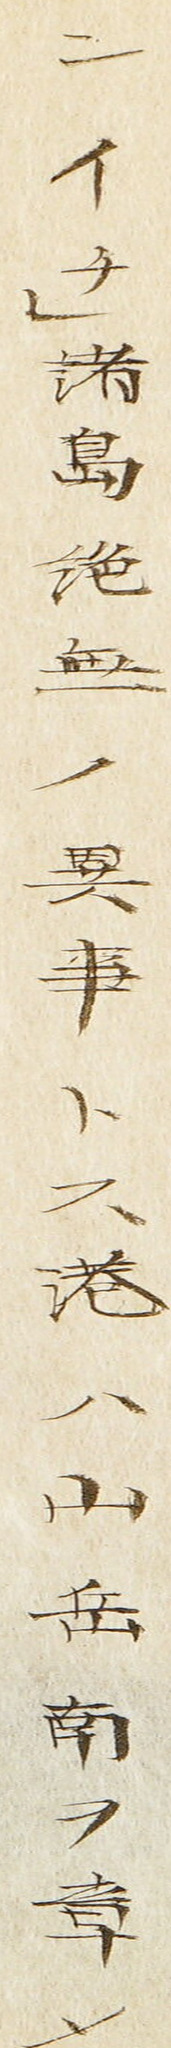ンイチ」諸島絶無ノ異事トス港ハ山岳南ヲ章シテ
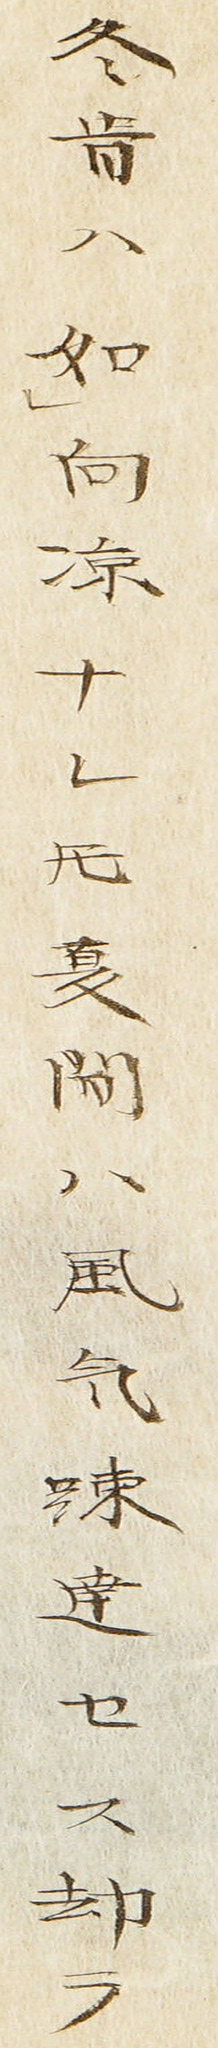冬旹如向涼ナレトモ夏間ハ風気疎達セス却ラ
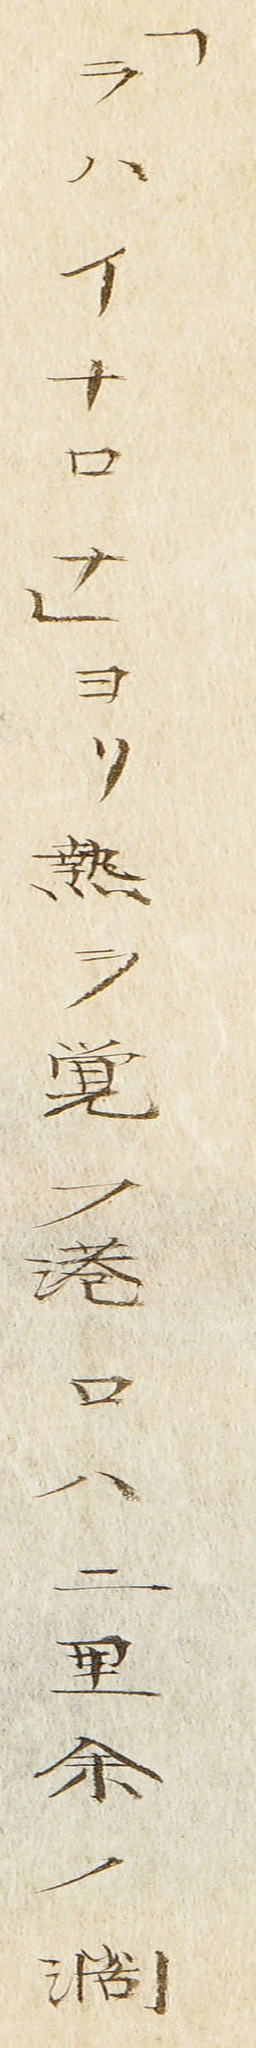「ラハイナロナ」ヨリ熱ヲ覚フ港口ニハ二里余ノ濶
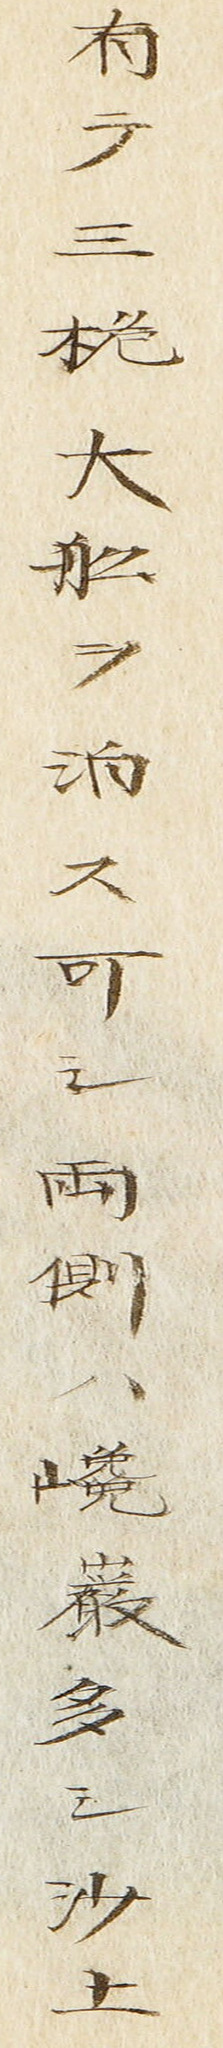有テ三桅大舶ヲ泊ス可シ両側ハ巉巖多シ沙上
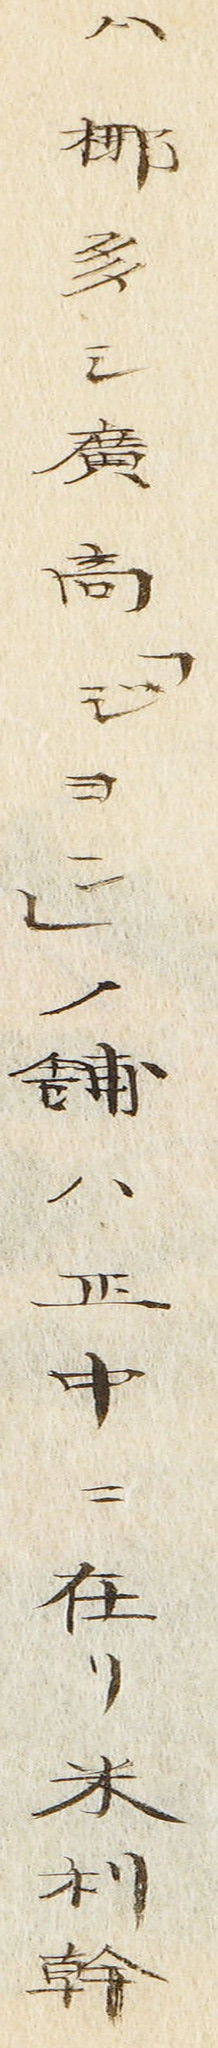ハ椰多シ廣商「ジヨン」ノ舗ハ正中ニ在リ米利幹
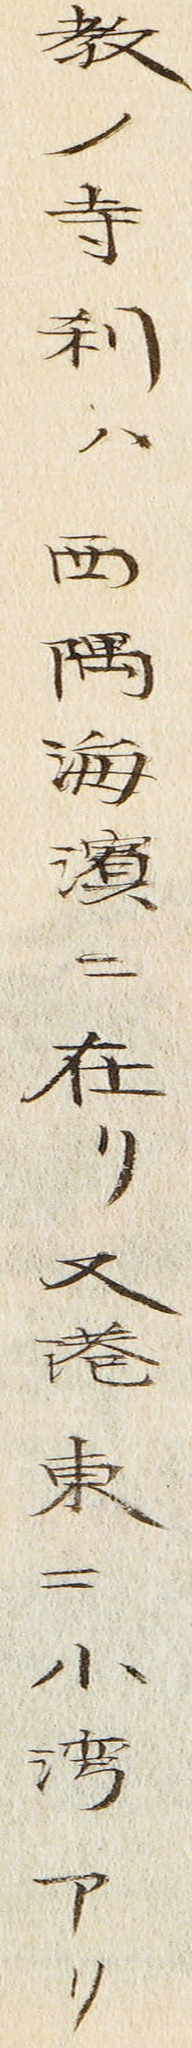教ノ寺刹ハ西隅海濱ニ在リ又港東ニ小湾アリ
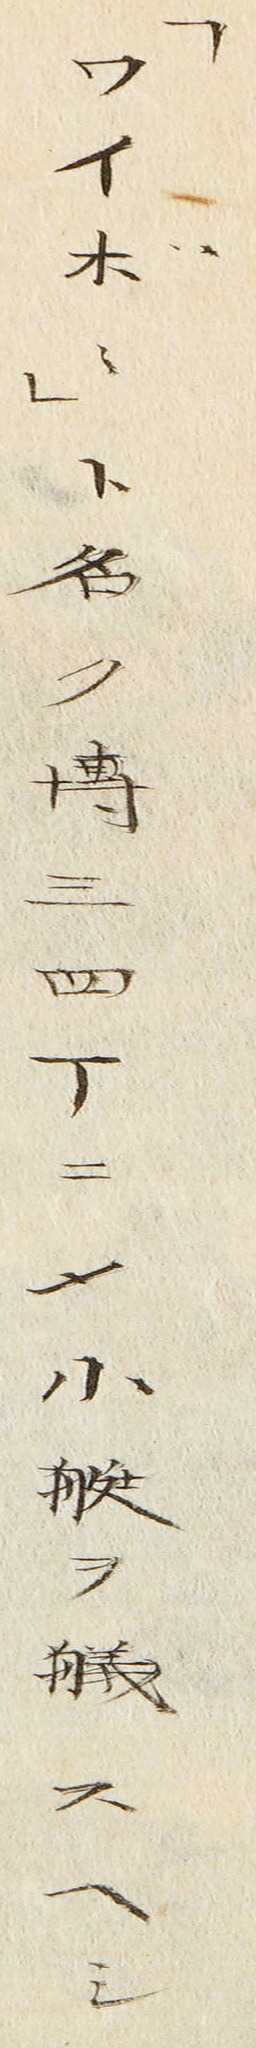「ワイホゝ」ト名ク博三四丁ニシテ小艇ヲ艤スヘシ
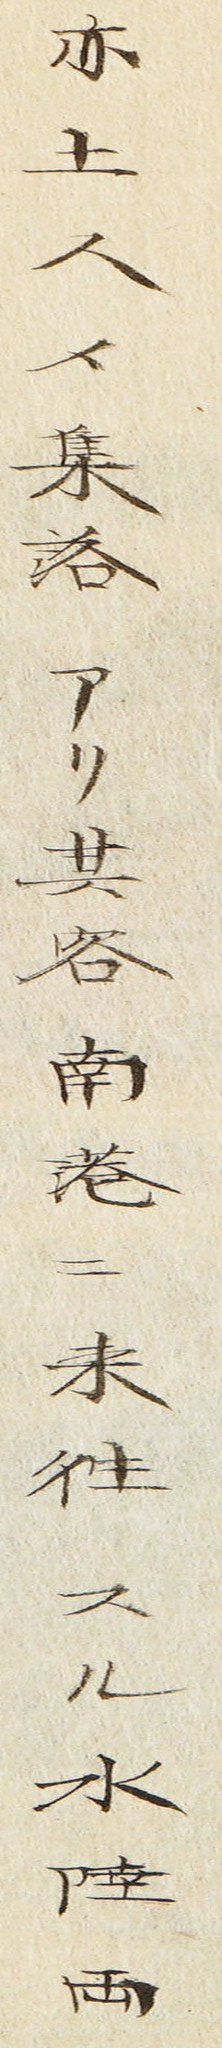又土人シテ集落アリ其客南港ニ来往スル水陸両
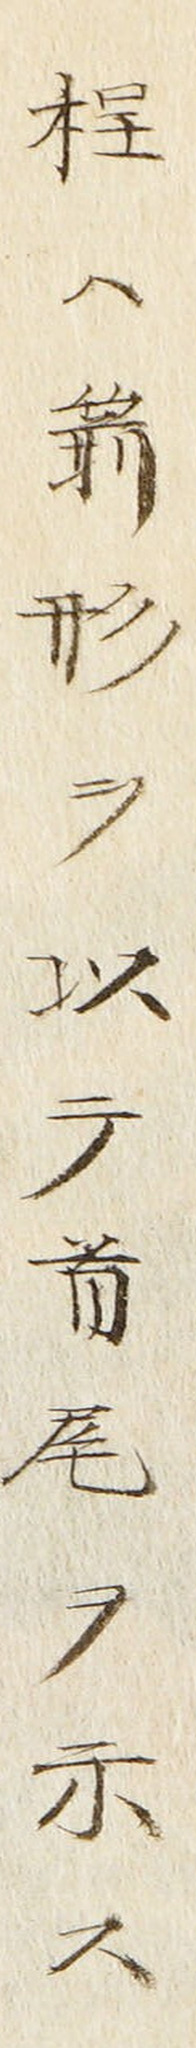程ハ箭形ヲ以テ首尾ヲ示ス

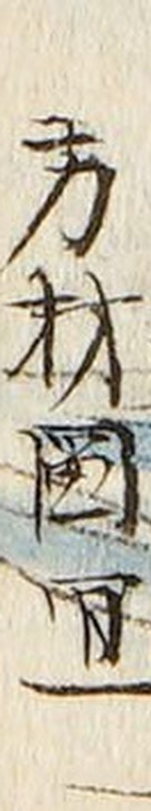方材図宜
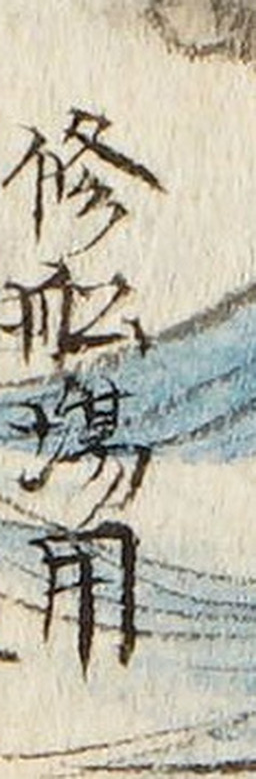修舩場用
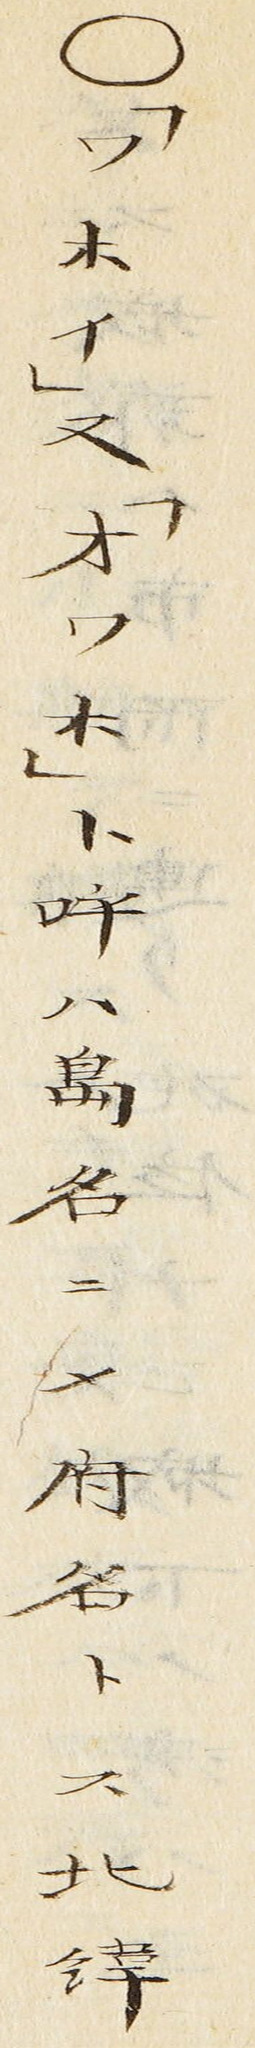〇「ワホイ」又「オワホ」ト呼ハ島名ニシテ府名トス北緯
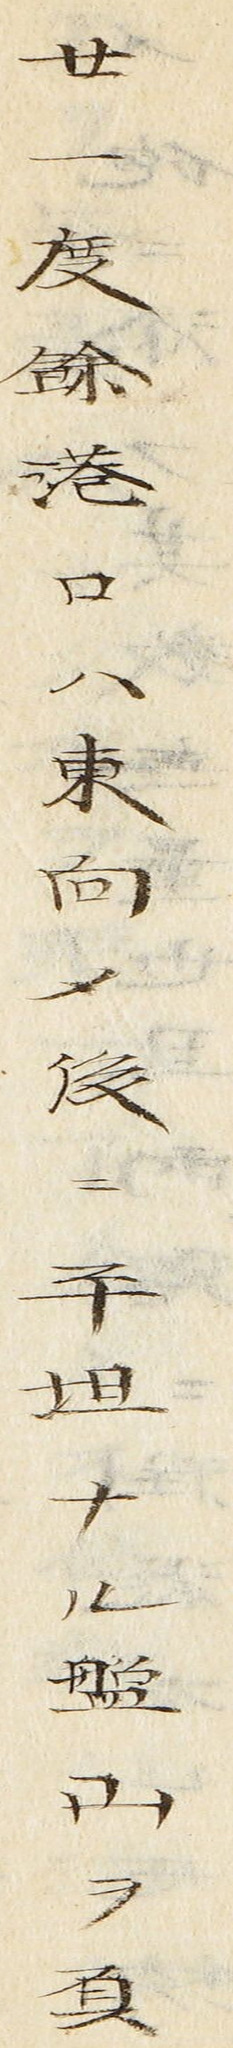廿一度余港口ハ東向シテ後ニ平坦ナル盤山ヲ負
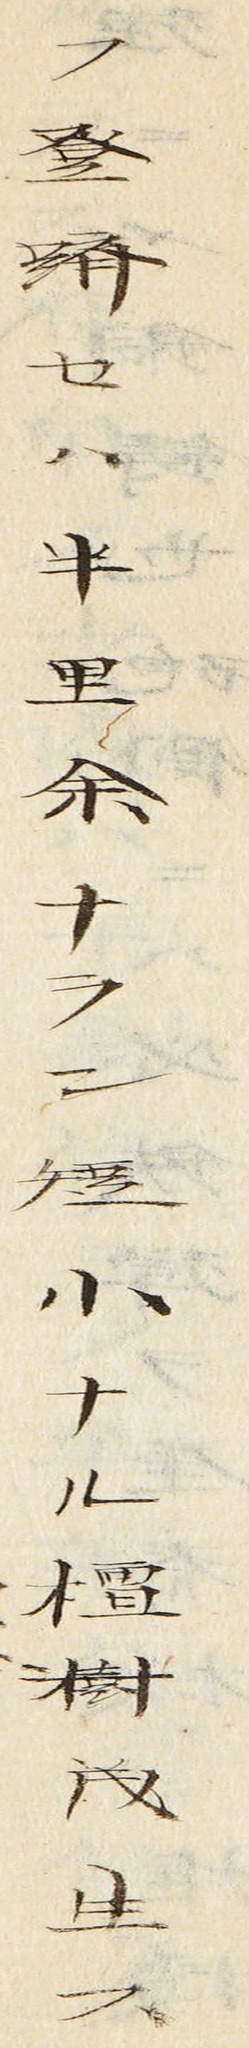フ登躋セハ半里余ナラン短小ナル檀樹茂生ス
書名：蕃談
